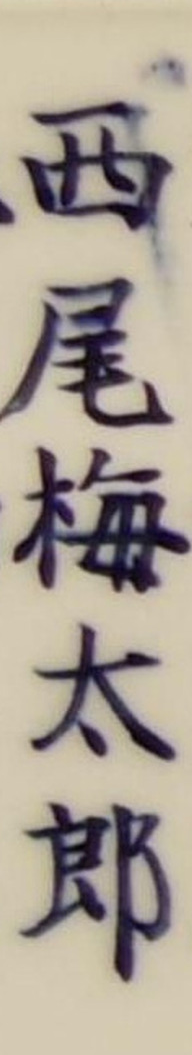西尾梅太郎
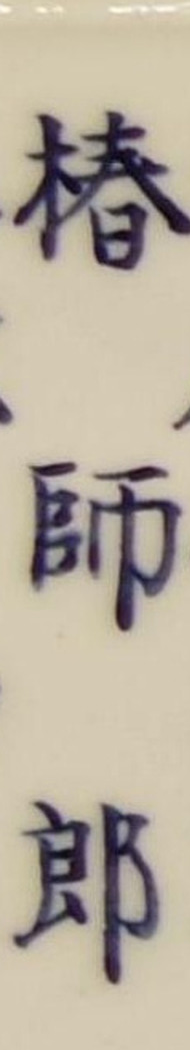椿師郎
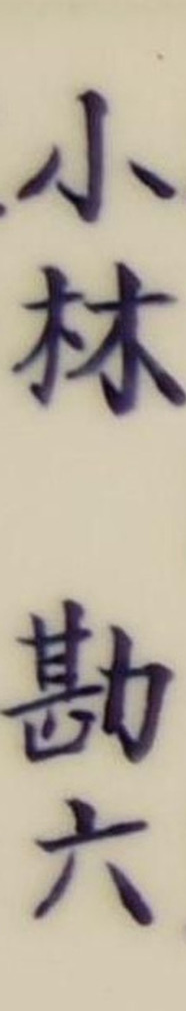小林勘六
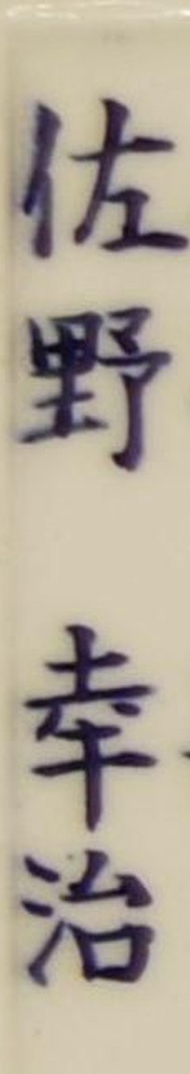佐野幸治

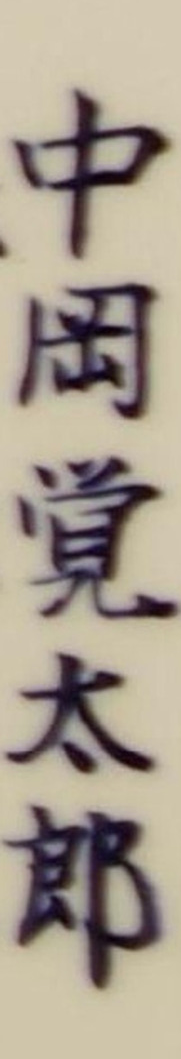中岡覚太郎
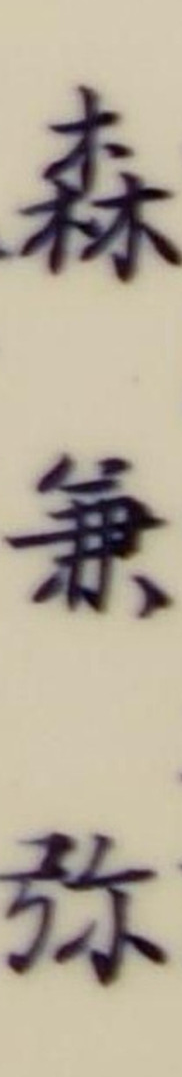森兼弥
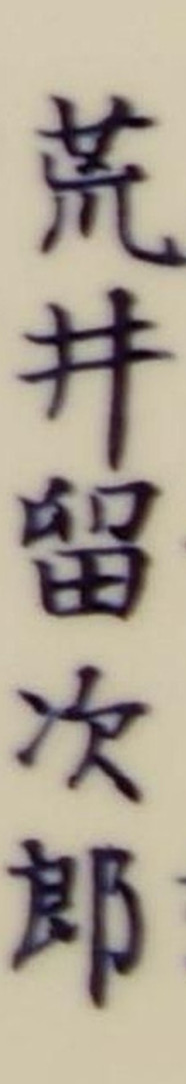荒井留次郎
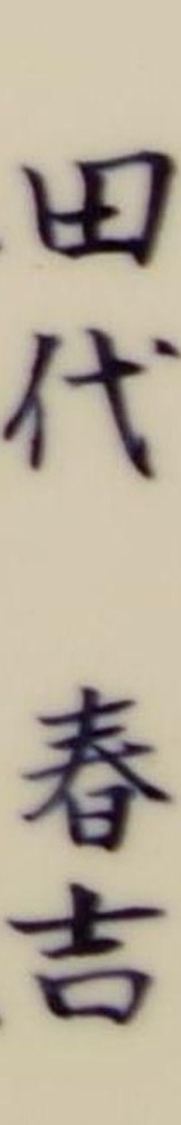田代春吉
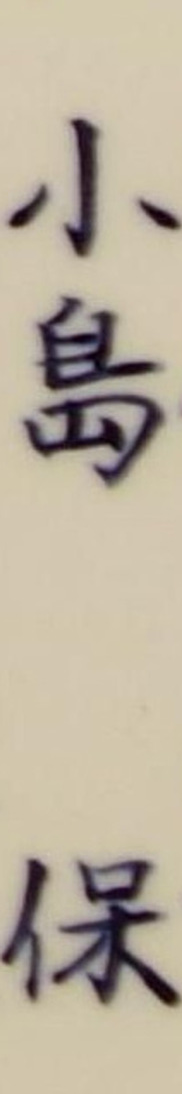小島保
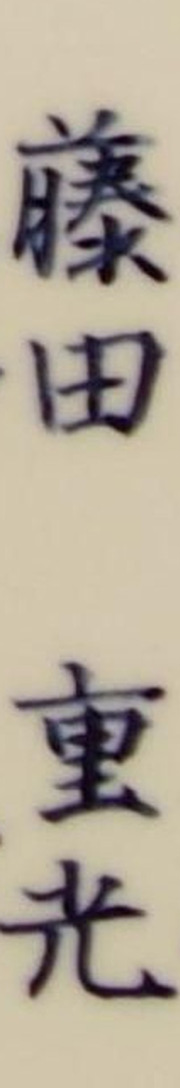藤田重光
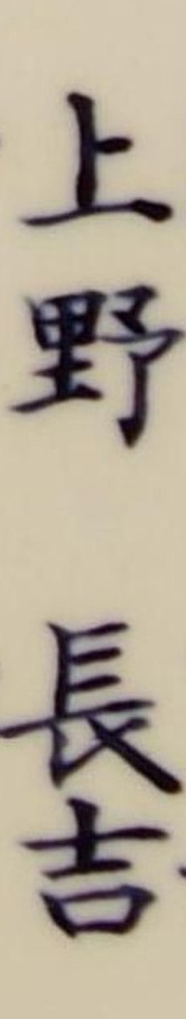上野長吉
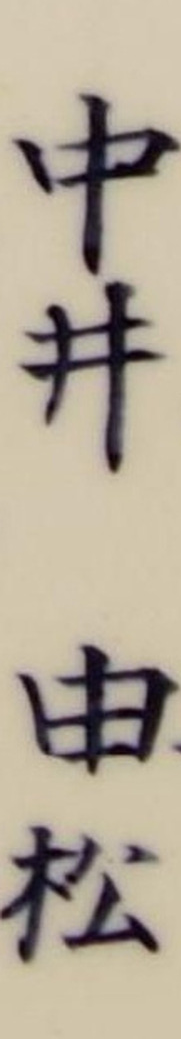中井由松
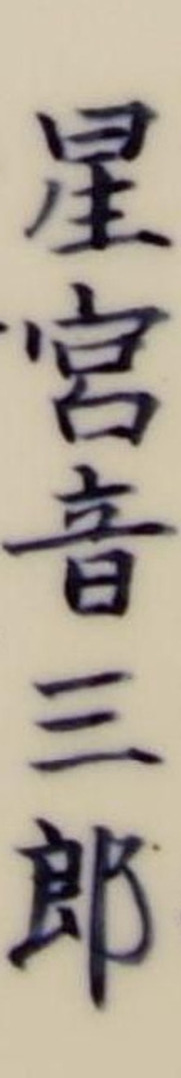星宮音三郎
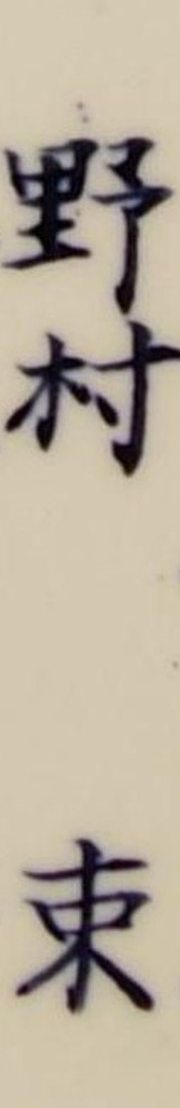野村束
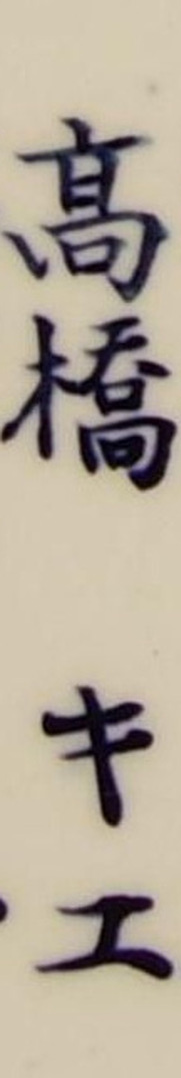高橋キ工
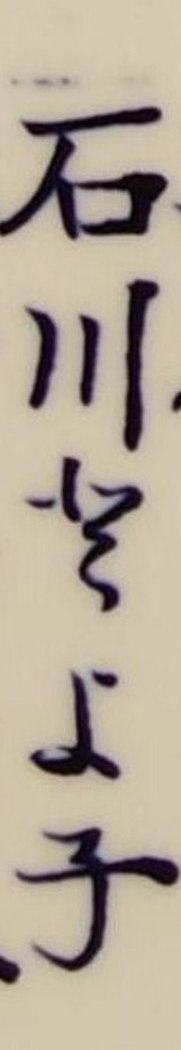石川とよ子
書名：E~L
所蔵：高野山金剛峯寺
